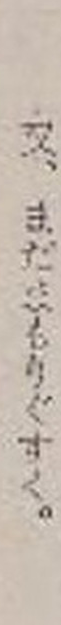又、まだまもりぐすく。
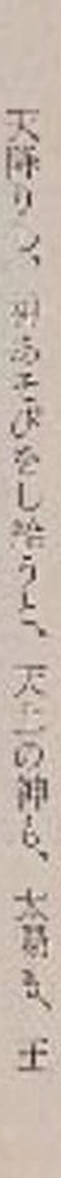天降りし、あそびをし給うと、天上の神も、太陽も、王
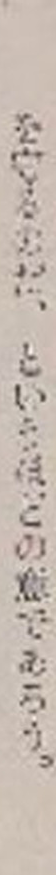を守るのだ、というほどの意であろう。
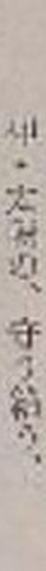神・太陽の、守り給う、
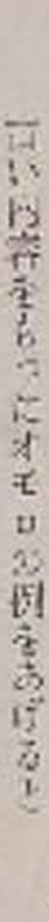古い内容をもったオモロの例をあげると
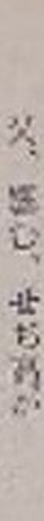又、響む、せぢ高が
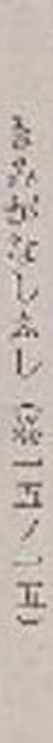きみがなしふし(巻一五ノ一五)
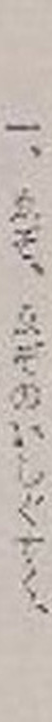一、ゑぞ、ゑぞのいしぐすく、
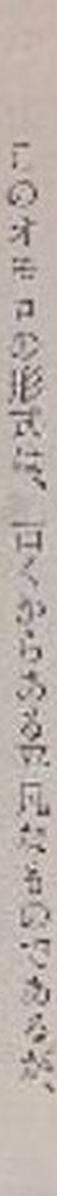このオモロの形式は、古くからある平凡なものであるが、
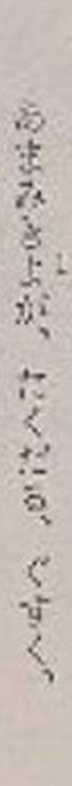あまみきよが、たくだる、ぐすく、
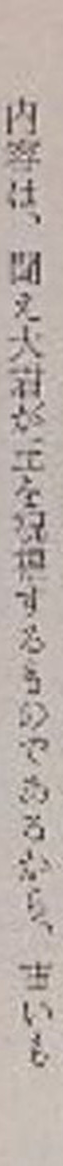内容は、聞え大君が王を祝福するものであるから、古いも
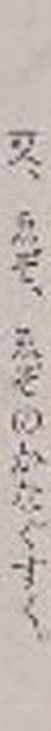又、ゑぞ、ゑぞのかなぐすく。
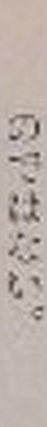のではない。
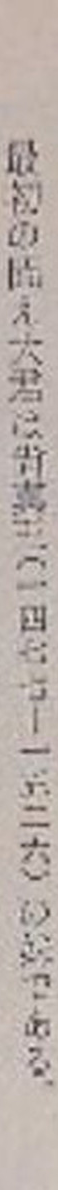最初の聞え大君は尚真王(一四七七―一五二六)の妹である。
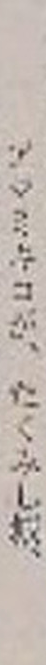アマミキヨが、たくみし城、
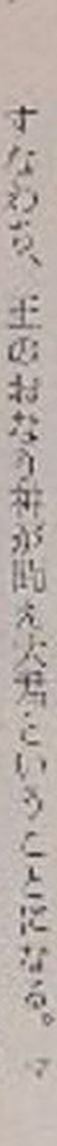すなわち、王のおなり神が聞え大君ということになる。マ
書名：沖縄口承文芸
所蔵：University of the Ryukyus Library
